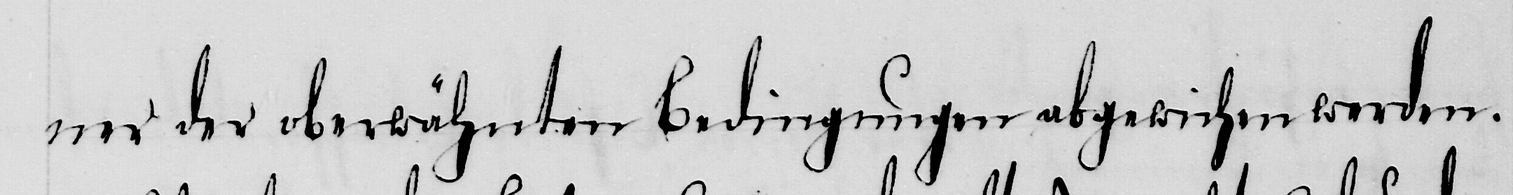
ner der oberwähnten Bedingungen abgewichen werden.
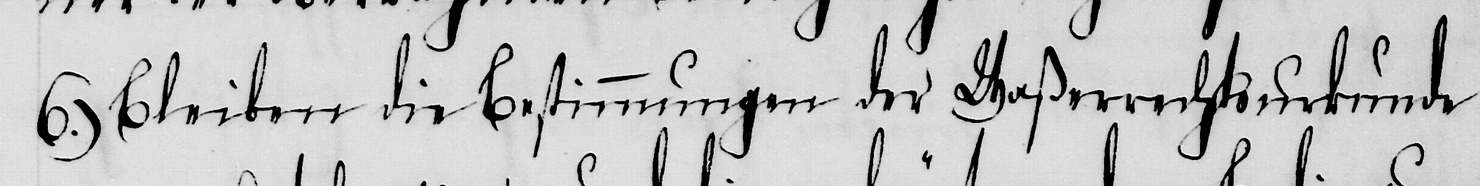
6.) Bleiben die Bestimmungen der Waßerrechtsurkunde
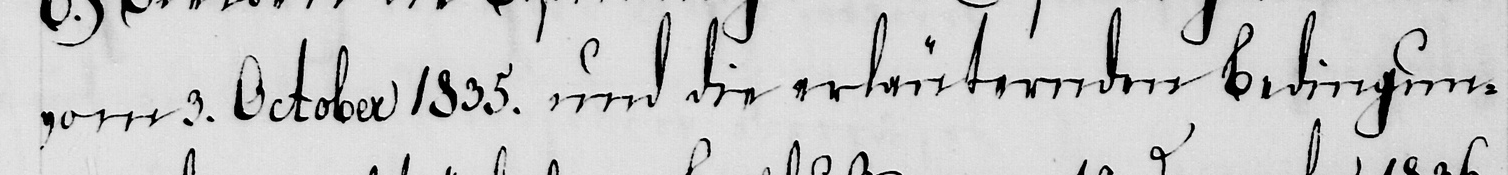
vom 3. October 1835. und die erläuternden Bedingun¬
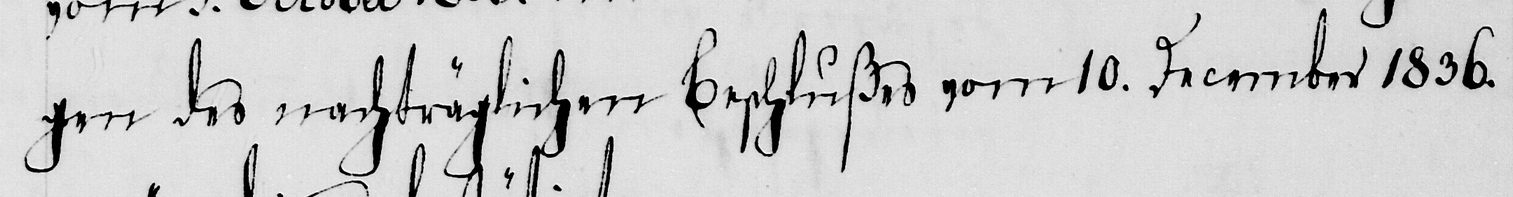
gen des nachträglichen Beschlußes vom 10. December 1836.
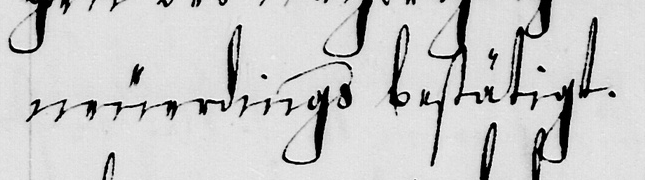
neuerdings bestätigt.
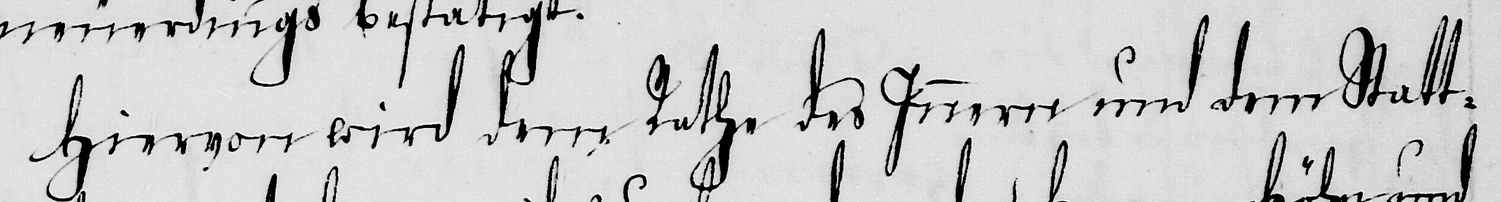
Hiervon wird dem Rathe des Innern und dem Statt¬
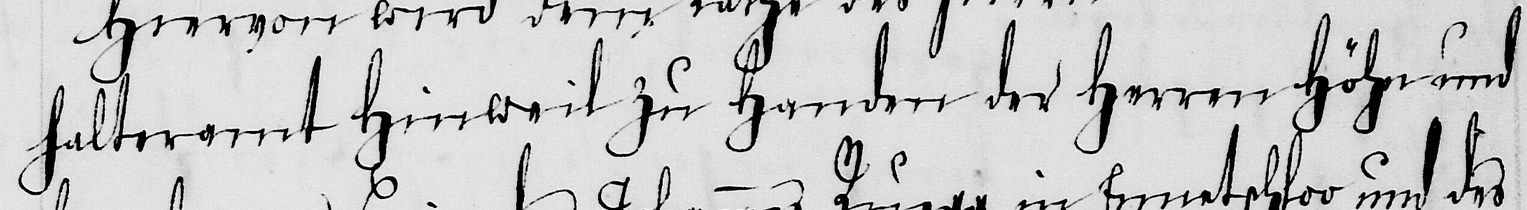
halteramt Hinweil zu Handen der Herren Höhn und
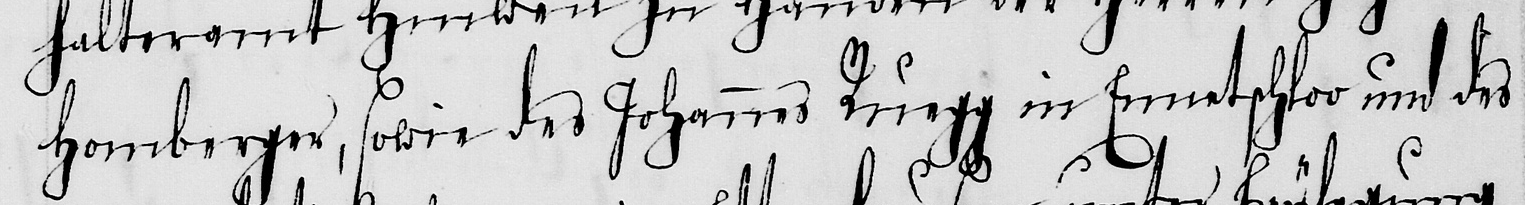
Homberger, sowie des Johannes Ruegg in Emetschloo und des
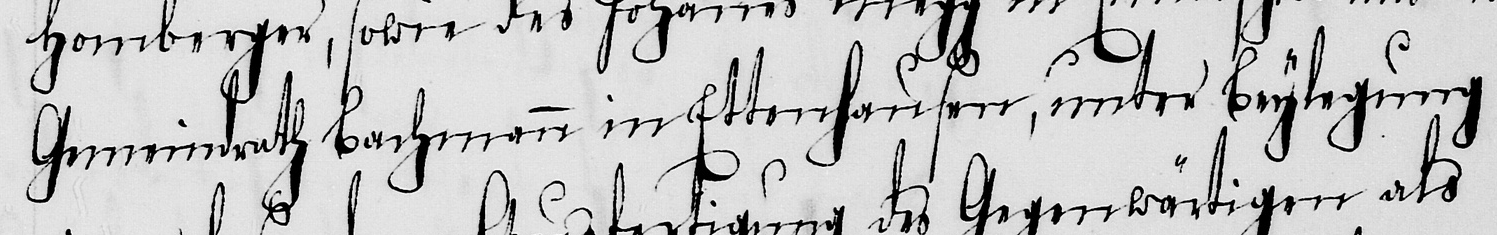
Gemeindrath Bachmann in Ettenhausen, unter Beylegung
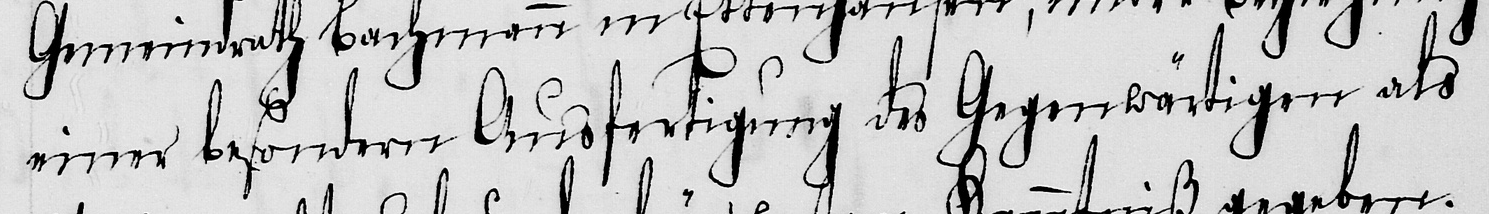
einer besondern Ausfertigung des Gegenwärtigen als
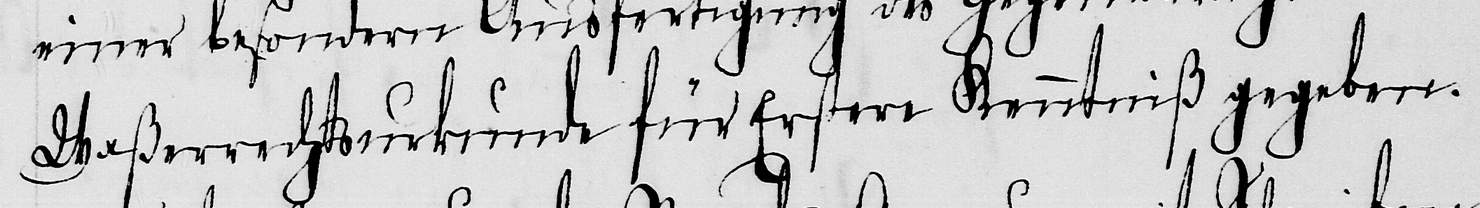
Waßerrechtsurkunde für Erstere Kenntniß gegeben.
